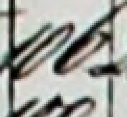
106
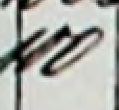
110
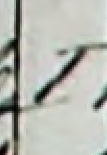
I
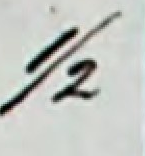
1/2
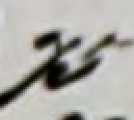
75
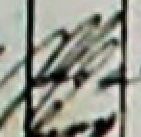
Pfl„
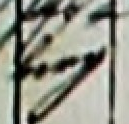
berg
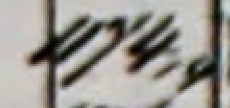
1174,4
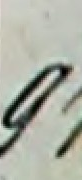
9
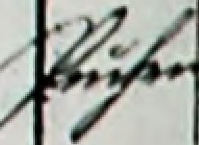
Puchen
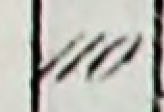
110
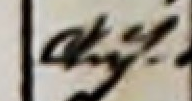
Aus„
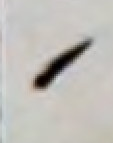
1
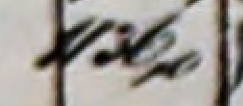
1136,0
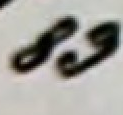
83
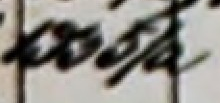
1335/a
